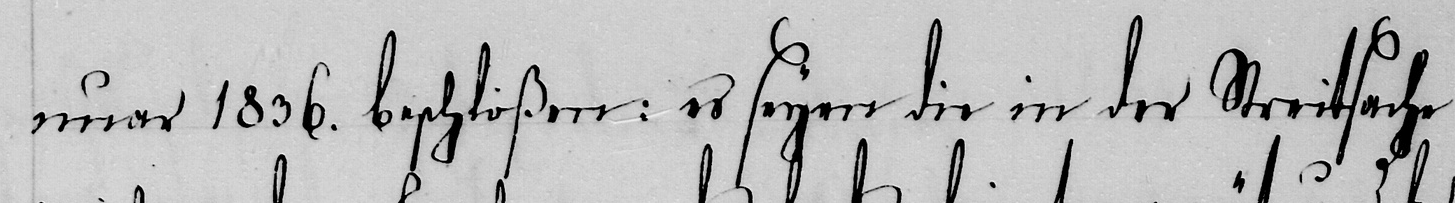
nuar 1836. beschloßen: es seyen die in der Streitsache
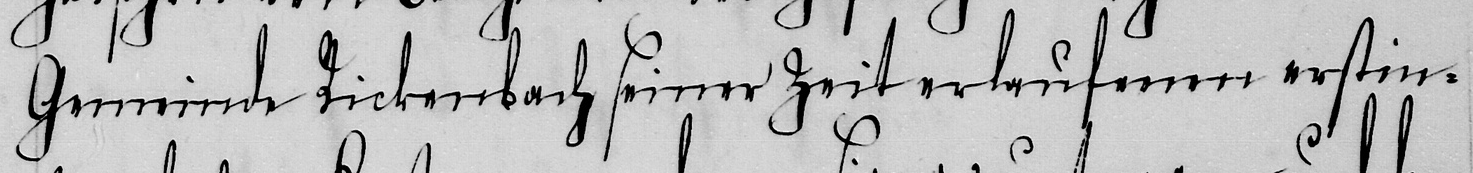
Gemeinde Rickenbach seiner Zeit erlaufenen erstin¬
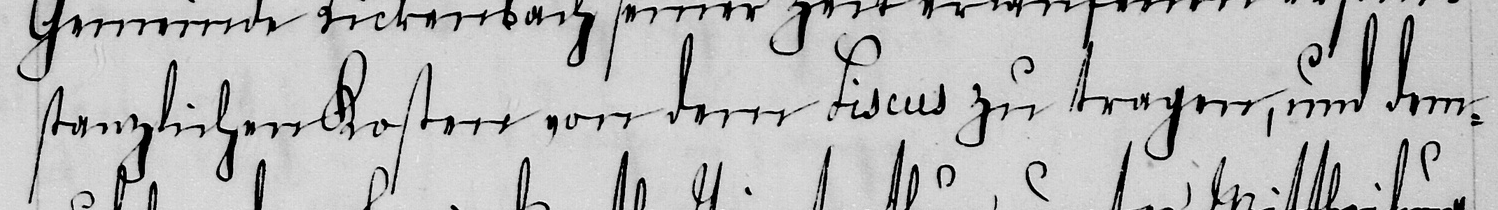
stanzlichen Kosten von dem Fiscus zu tragen, und dem¬
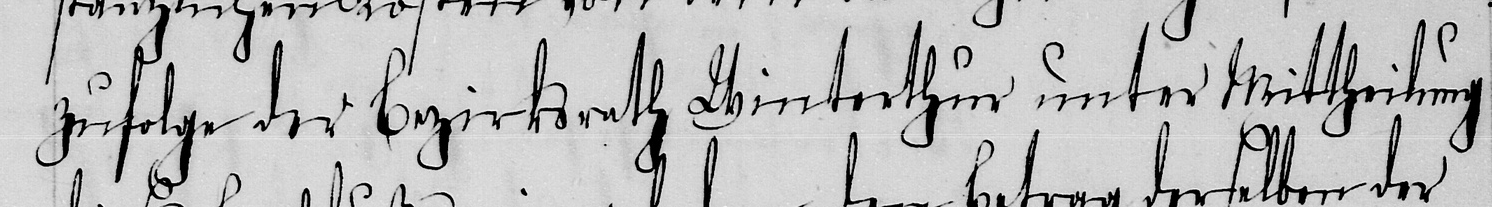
zufolge der Bezirksrath Winterthur unter Mittheilung
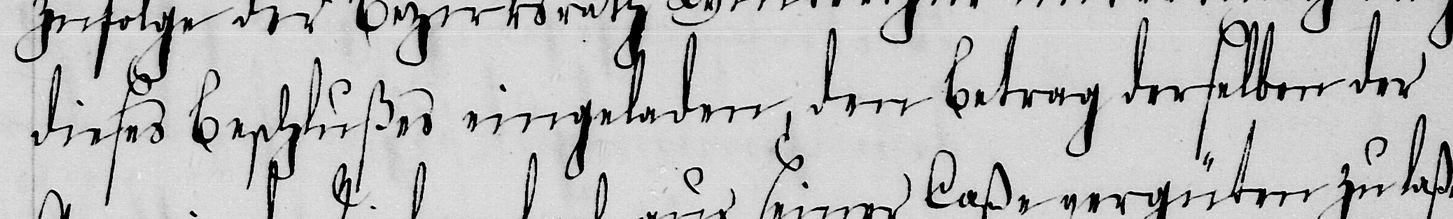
dieses Beschlußes eingeladen, den Betrag derselben der
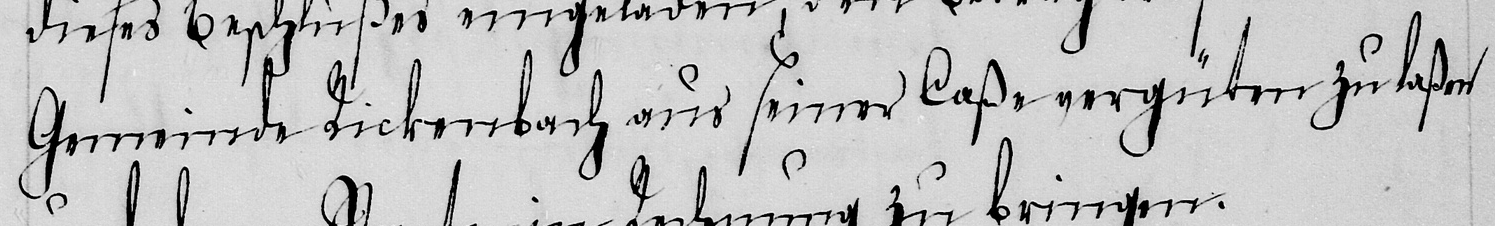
Gemeinde Rickenbach aus seiner Caßa vergüten zu laßen
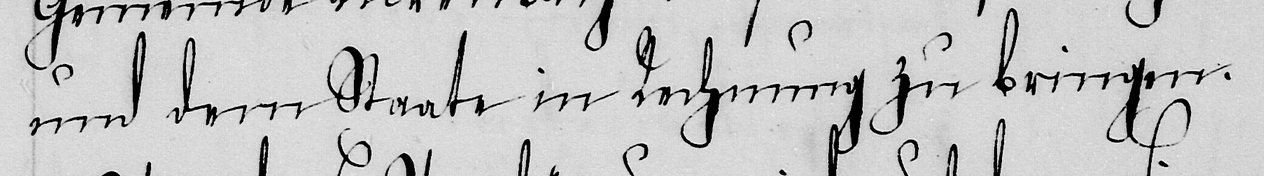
und dem Staate in Rechnung zu bringen.
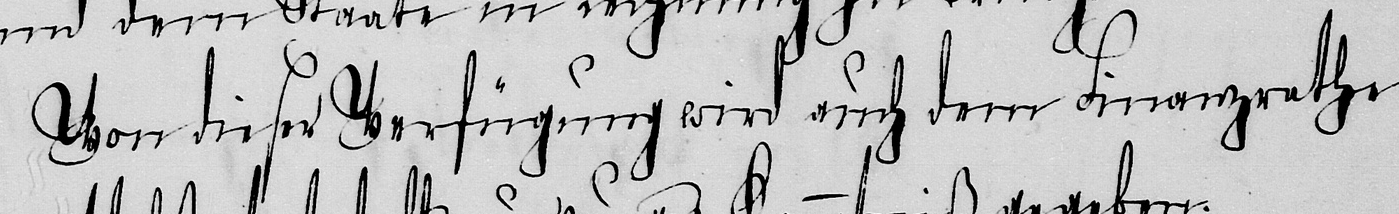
Von dieser Verfügung wird auch dem Finanzrathe
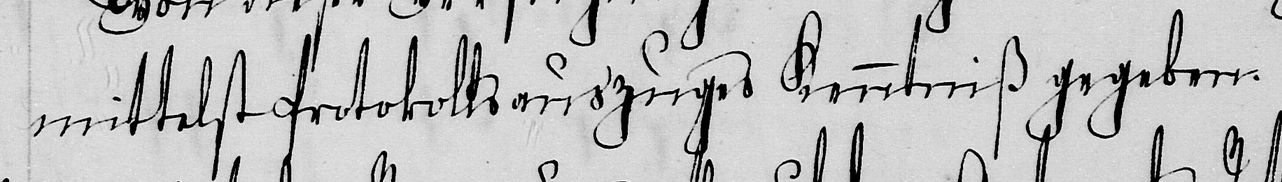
mittelst Protokollsauszuges Kenntniß gegeben.
